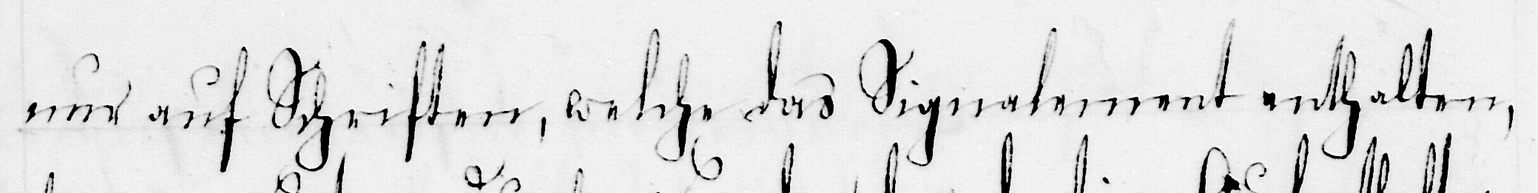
nur auf Schriften, welche das Signalement enthalten,
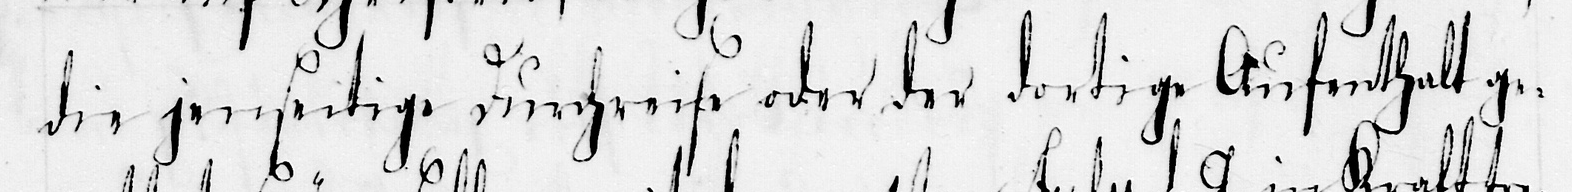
die jenseitige Durchreise oder der dortige Aufenthalt ge¬
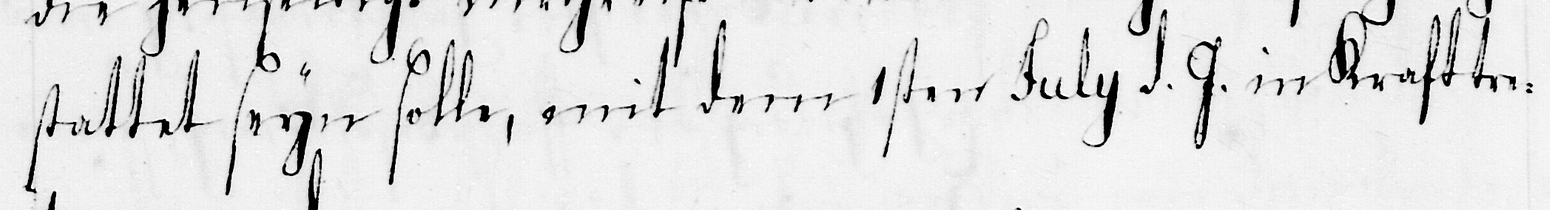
stattet seyn solle, mit dem 1sten July d. J. in Kraft tre¬
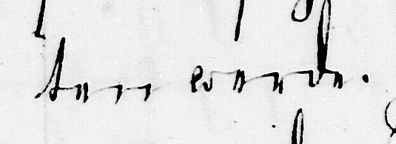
ten werde.
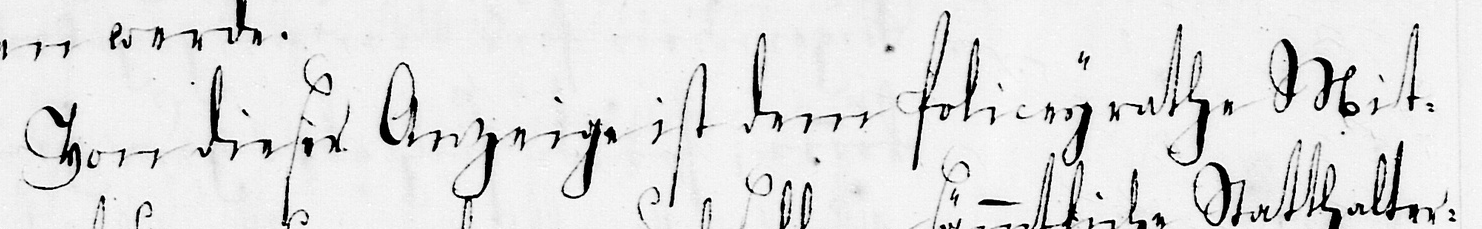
Von dieser Anzeige ist dem Policeyrathe Mit¬
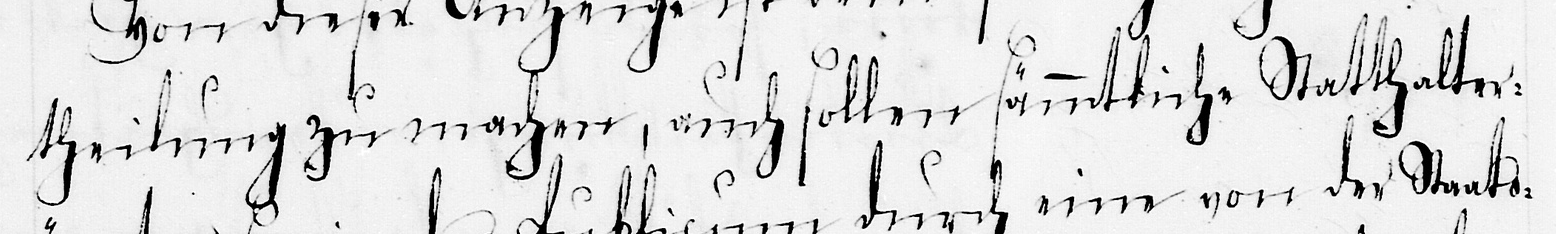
theilung zu machen, auch sollen sämmtliche Statthalter¬
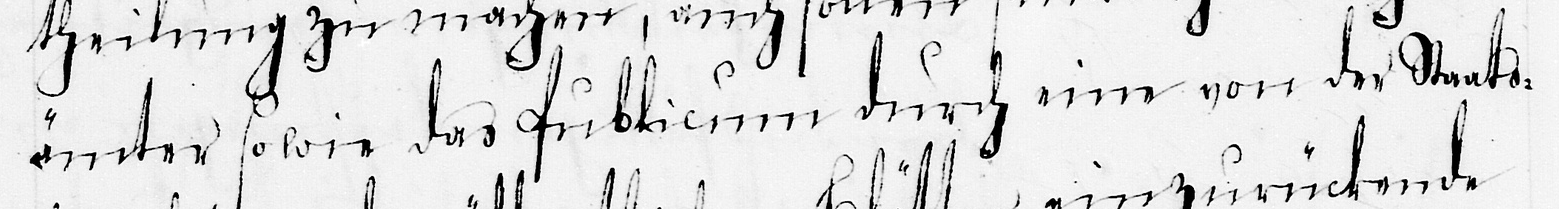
ämter sowie das Publicum durch eine von der Staat¬
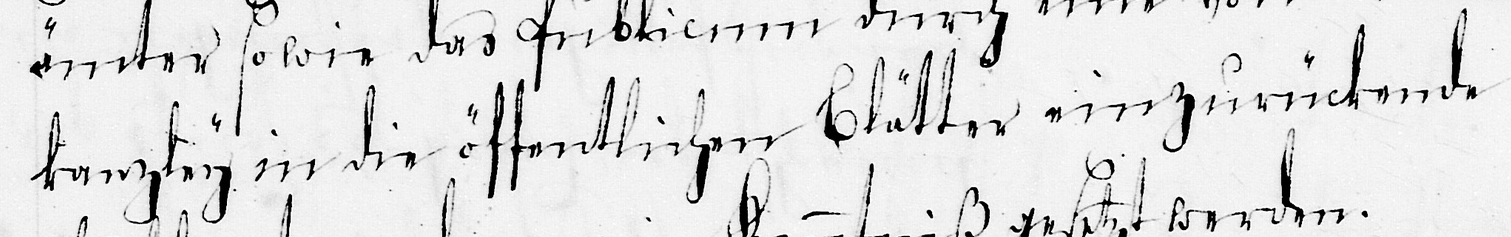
skanzley in die öffentlichen Blätter einzurückende
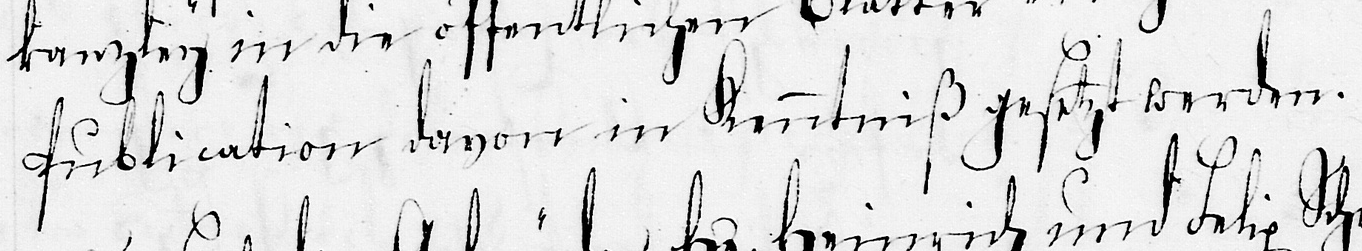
Publication davon in Kenntniß gesetzt werden.
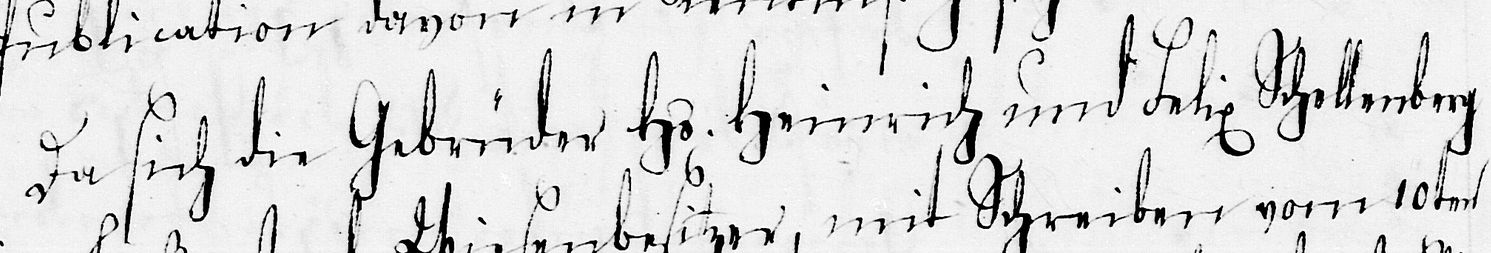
Da sich die Gebrüder Hs. Heinrich und Felix
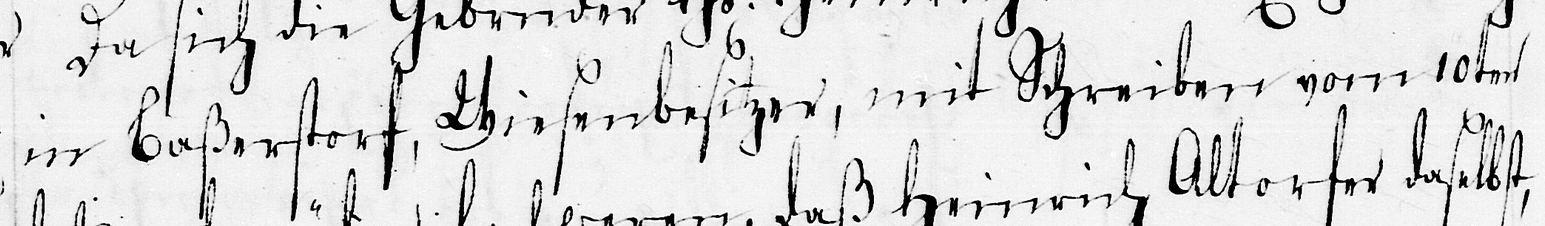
in Baßerstorf, Wiesenbesitzer, mit Schreiben vom 10ten
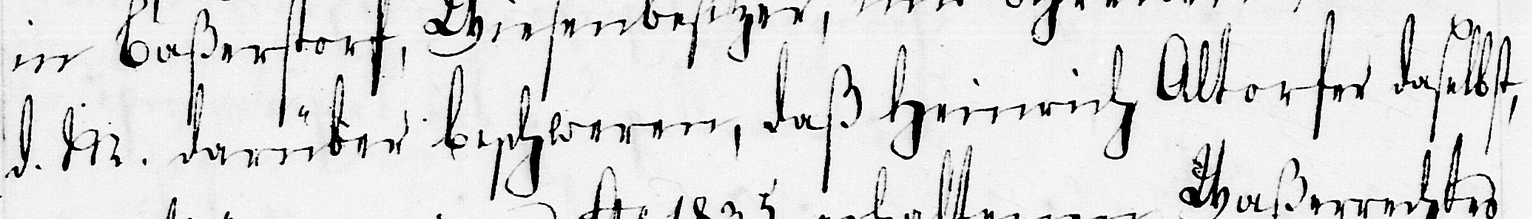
d. M. darüber beschweren, daß Heinrich Altorfer daselbs¬
